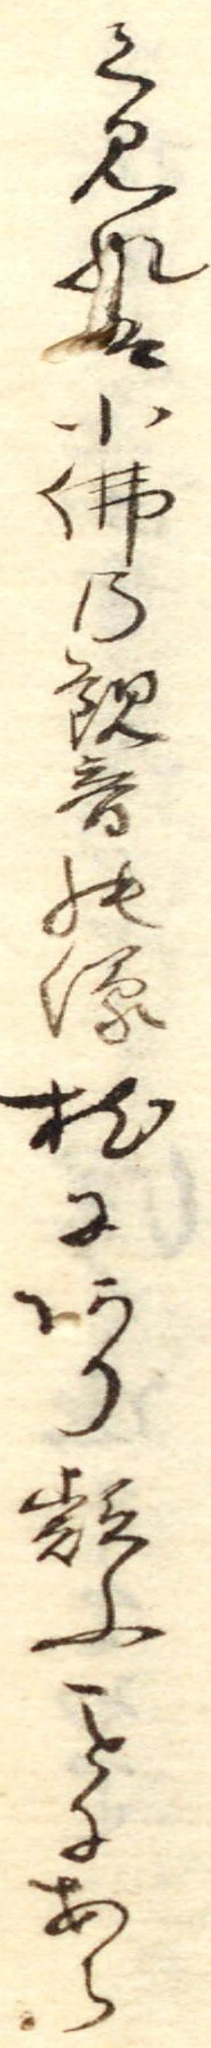て見れは小仏の観音の像枕にあり疑ふことにあら
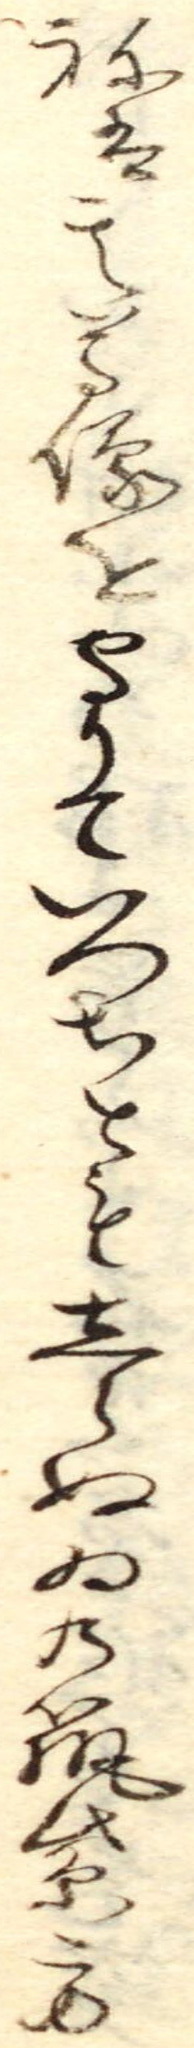ねは其尊像を守りていつちともしらぬゐの筑紫方
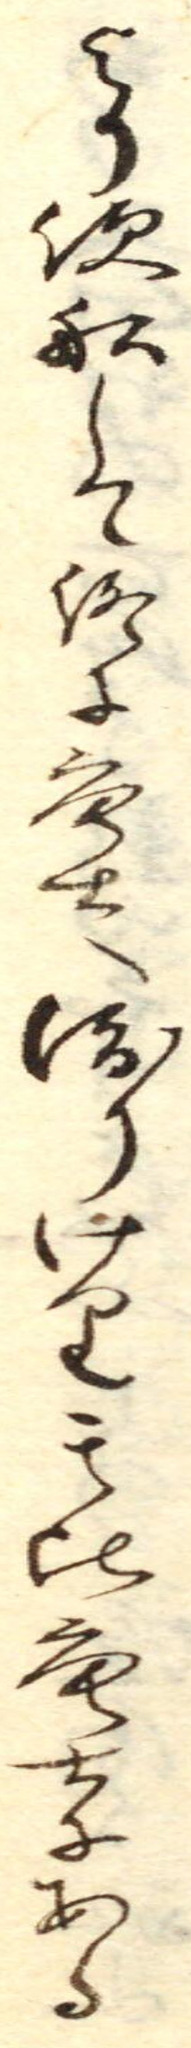より便船して終に唐土へ渡りけり其比唐土にある
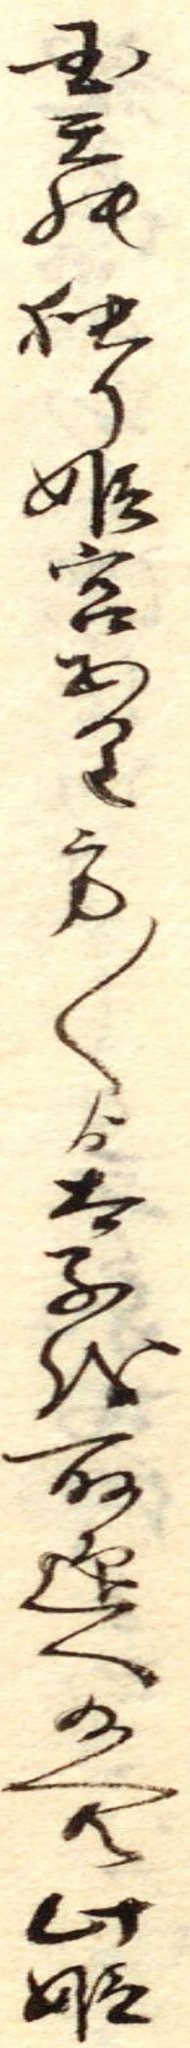国王の独り姫宮あり方〳〵ゟ太子を取迎へ給へ共此姫
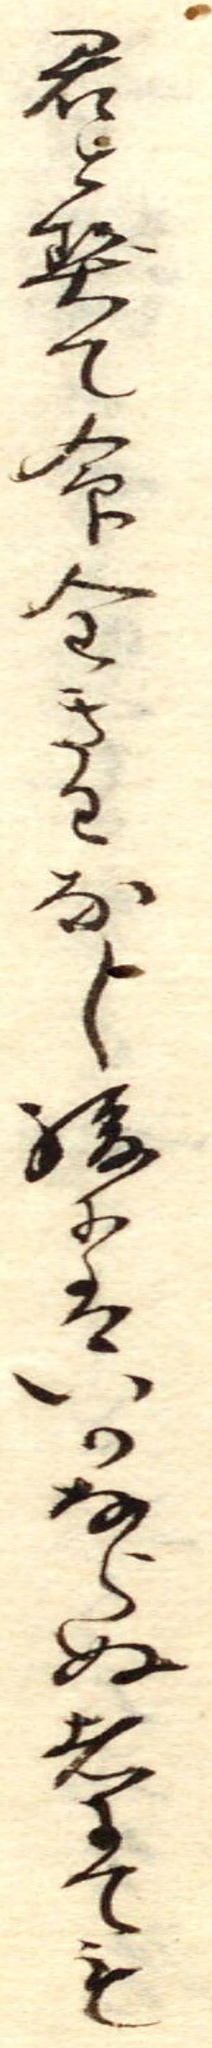君と契て命全き王なし後にはいかならぬ者にても
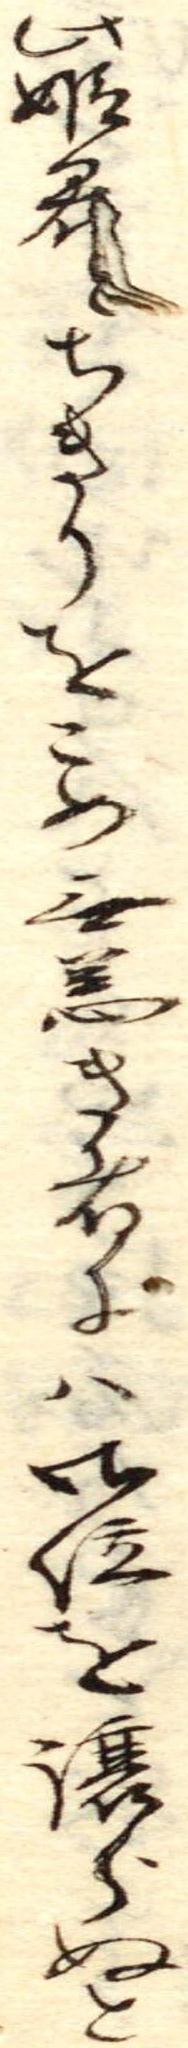此姫君とちきりをこめ無恙き者には御位を譲らぬと
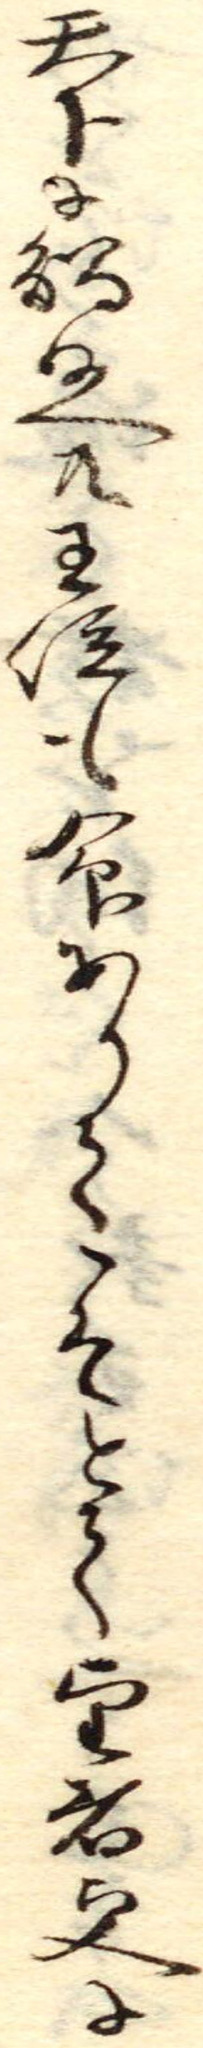天下に触給へ共王位も命ありてこそとて望者更に
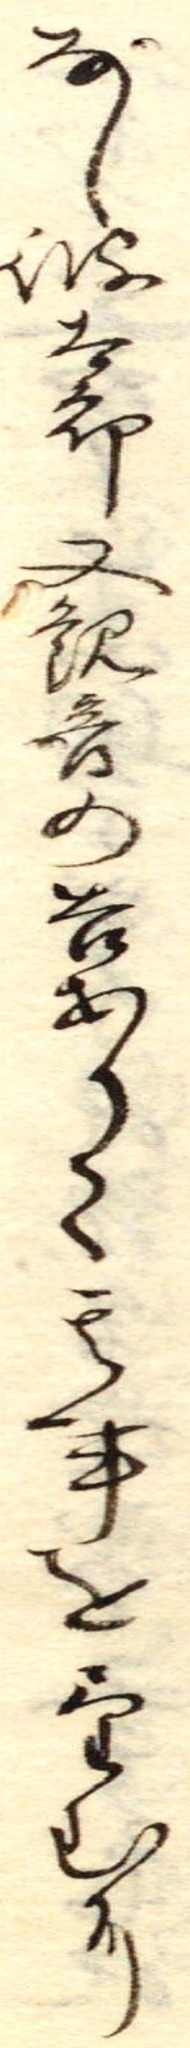なし彼太郎又観音の告ありて其事を望むに
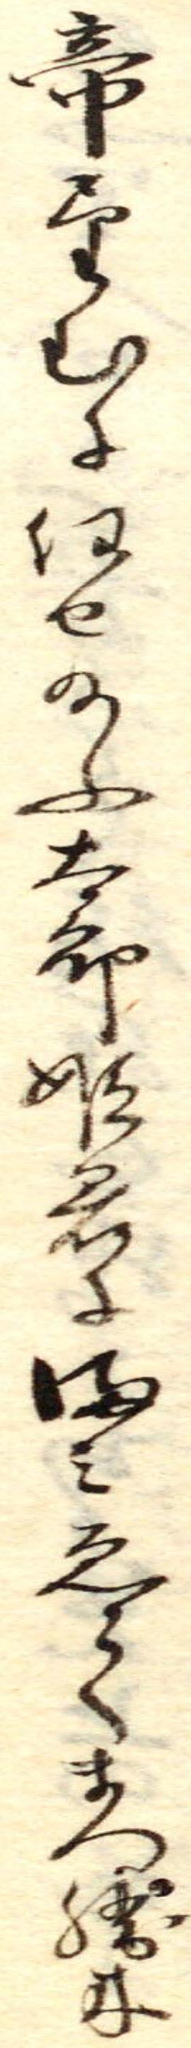帝望むに任せ給ふ太郎姫君にまみゑてまつ勝木
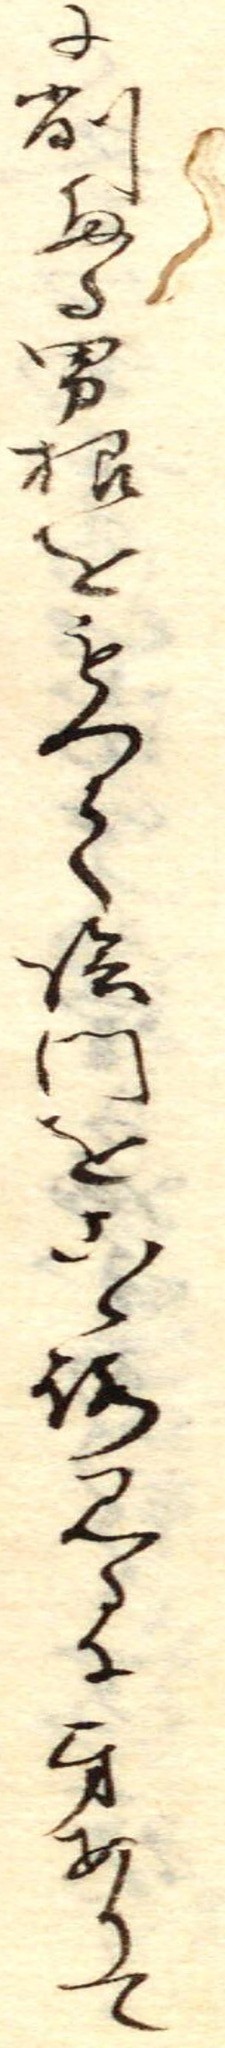に削たる男根をもつて陰門をこゝろみるに牙ありて
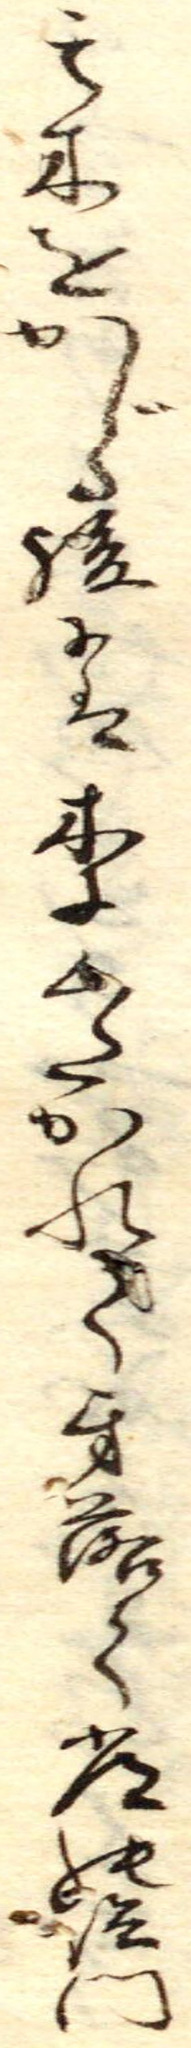其木をかじる後には木にくたかれて牙落て常の陰門
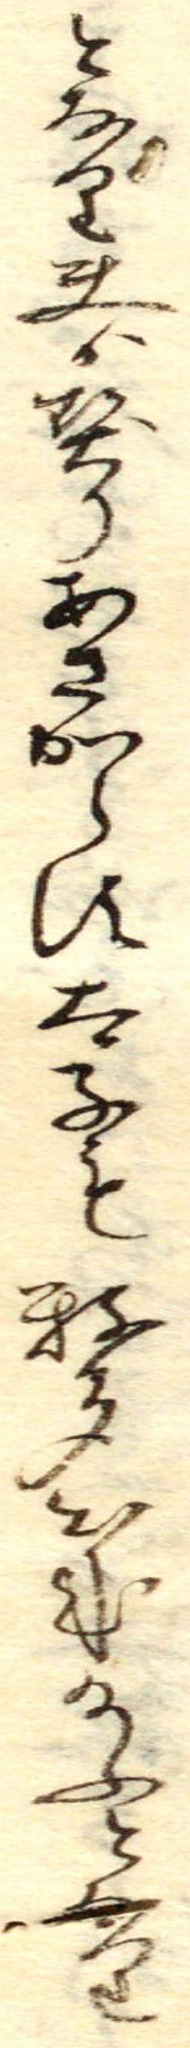となり夫ゟ契りあさからす太子も数多出来給ふとあり

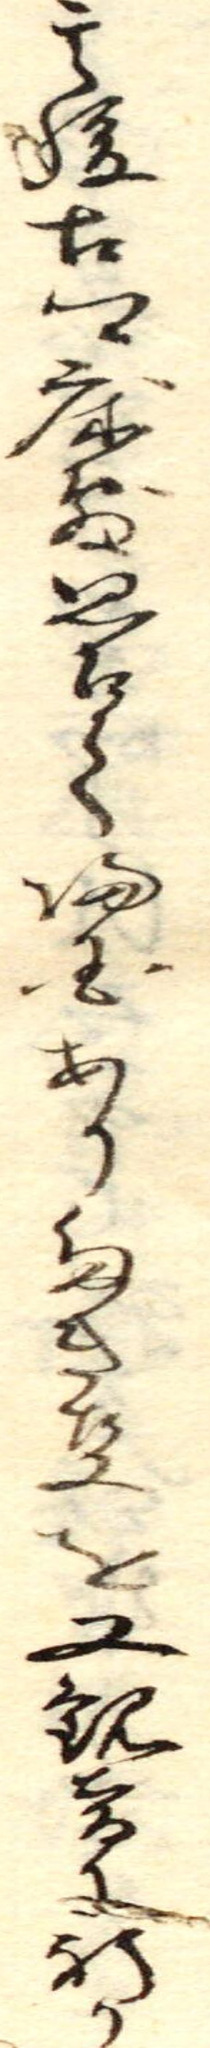其後古郷床敷思召て帰国ありたき事を又観音に祈り
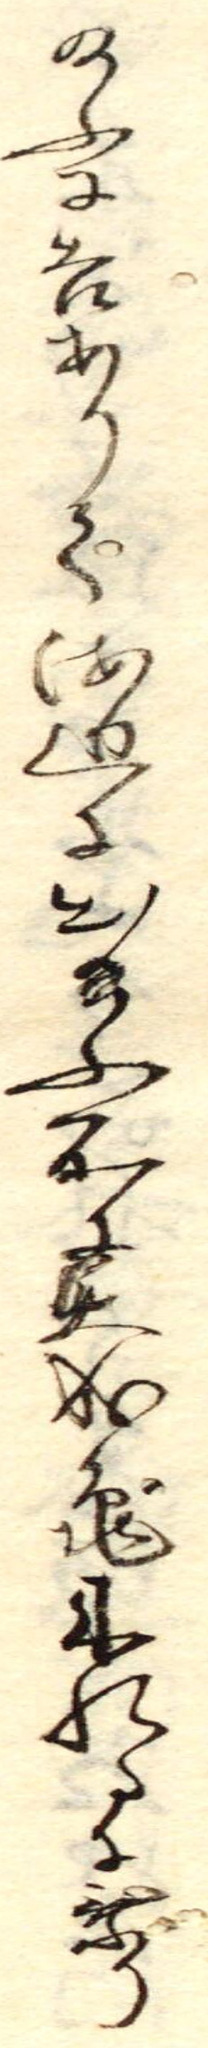給ふに告ありて海辺に出給ふ所に大成亀来れるに海苔乗り
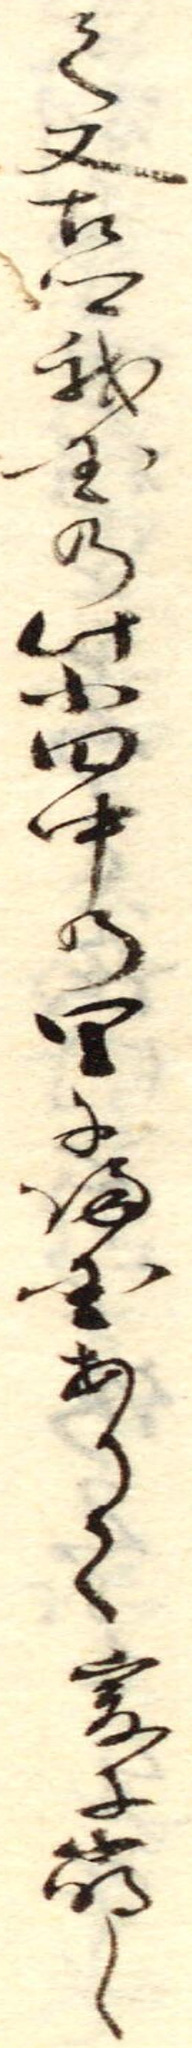て又古郷我国の此小田中の里に帰国ありて爰に崩し
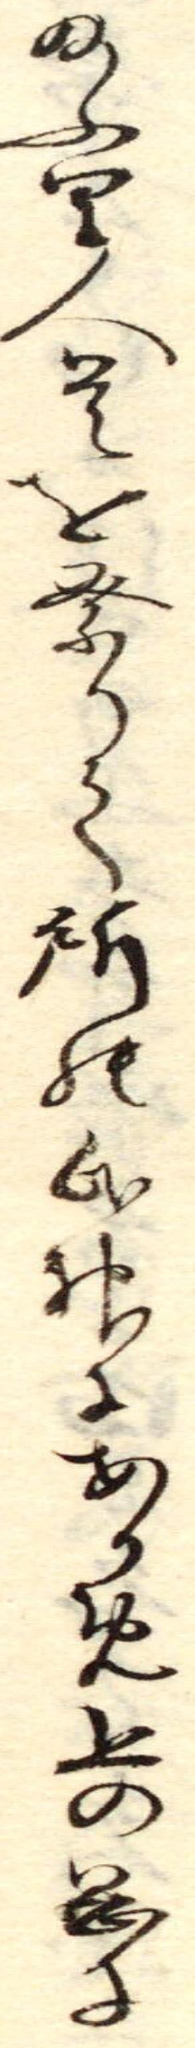給ふ里人是を祭りて所の氏神にありめ上の岡に
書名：能登名跡誌
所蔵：Ishikawa Prefectural Library
